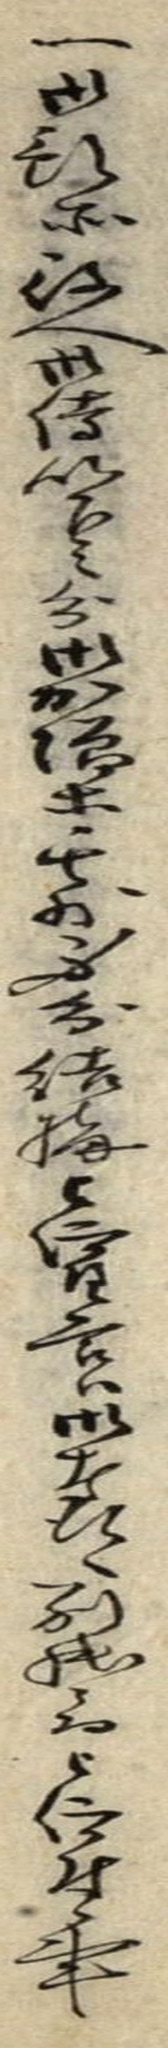一御預所役人御侍以下之分御加増等其外身分結構被仰付候節は御奉行へ別紙に而被仰付候事
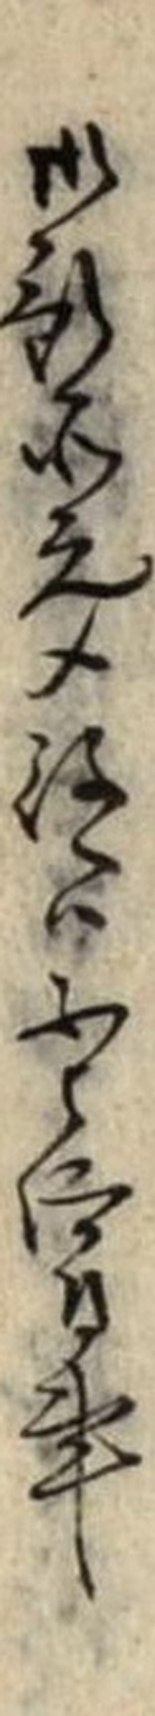御預所元〆役へは不被仰付事

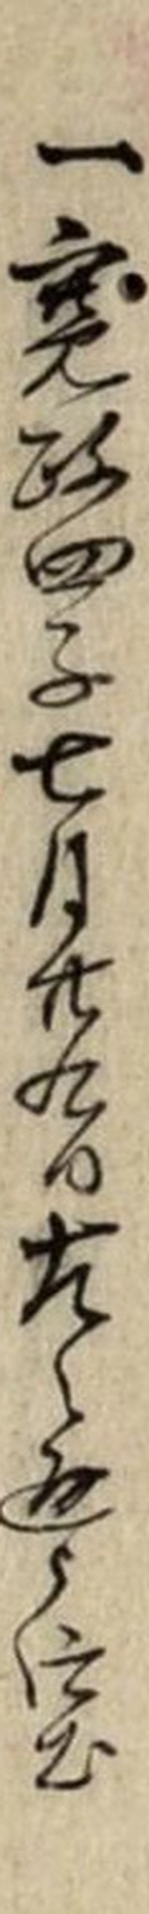一寛政四子七月廿九日左之通被仰出
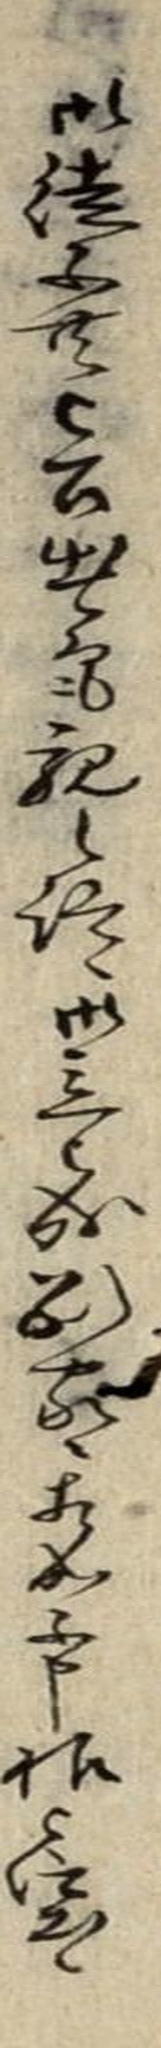御徒子共被召出候而も親之跡へ御立被成別家へ相成不申様被仰出候
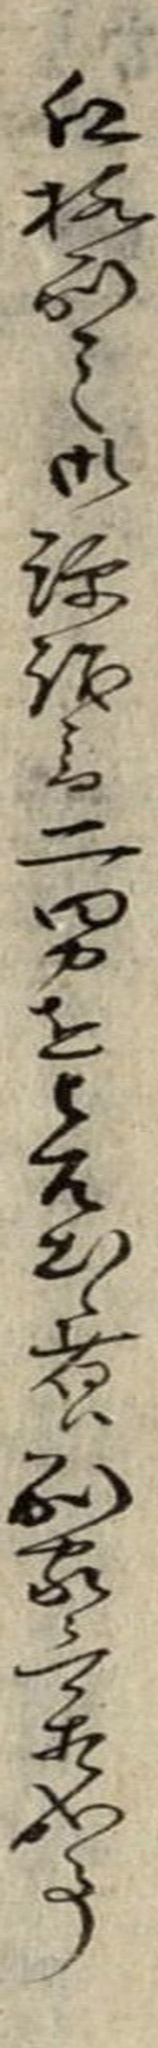但格別之御評議に而二男を被召出候者は別家に可相成事
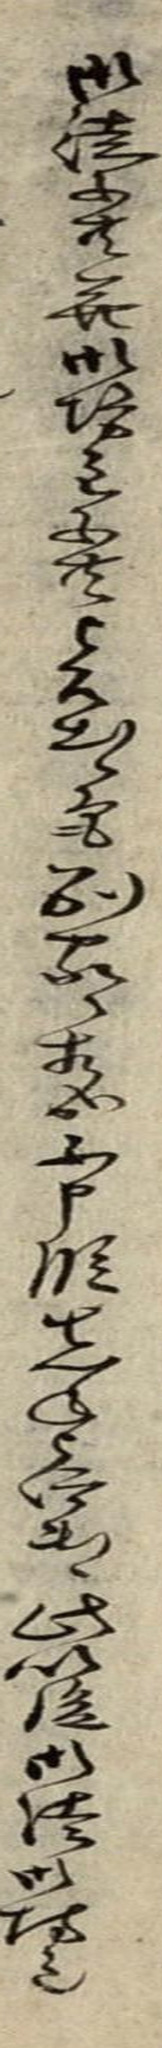御徒子共并御坊主子共被召出候而も別家に相成不申段先年被仰出候此以後御徒御坊主
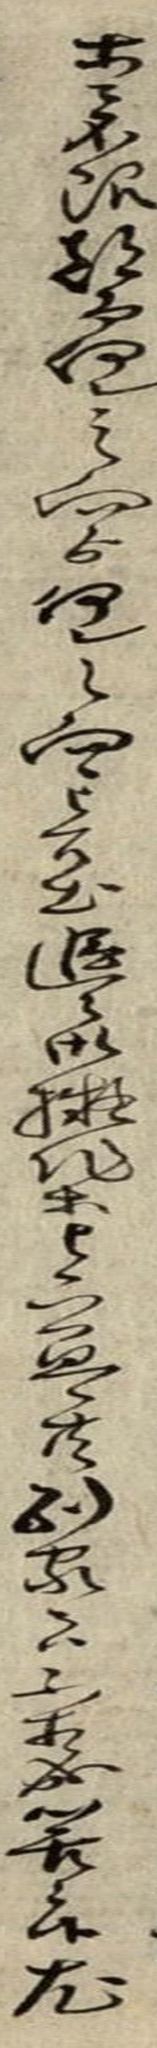等に不限都而何れ之向ゟ何れ之向へ被召出追々御擬作等被下置候共別家には不相成筈に候尤
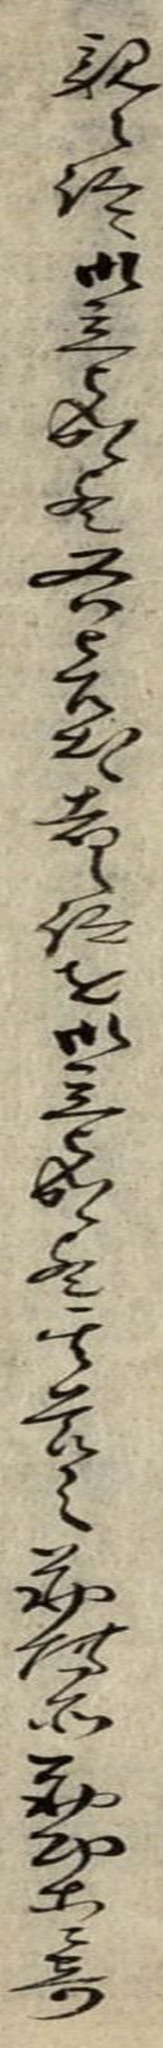親之跡へ御立被成候歟又は被召出候者之跡を御立被成候歟其節之勤場所勤功等に寄
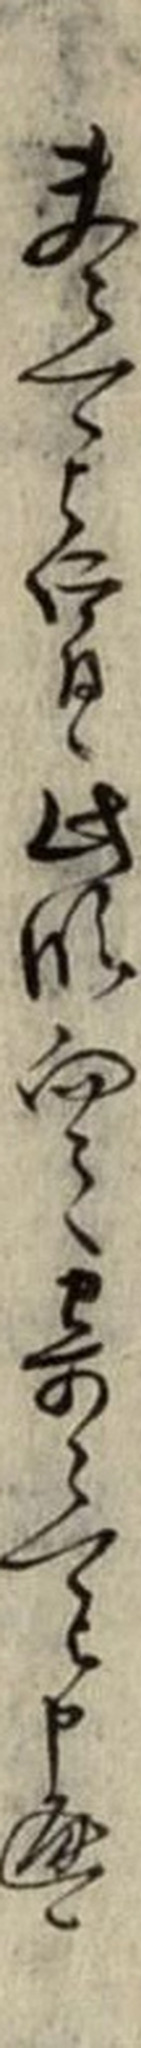夫々可被仰付候此段向々へ寄々可被申通候
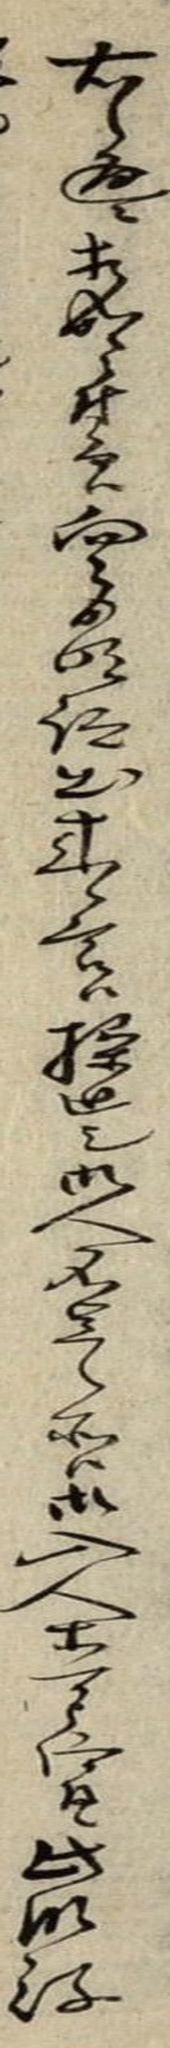右之通に相成候に付而は向々ゟ明跡出来候節は繰廻し御人不足之所は御入人等可被仰付候此段役
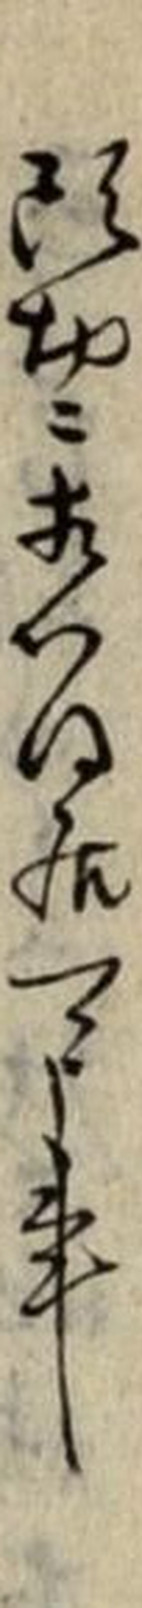頭切に相心得居可申事
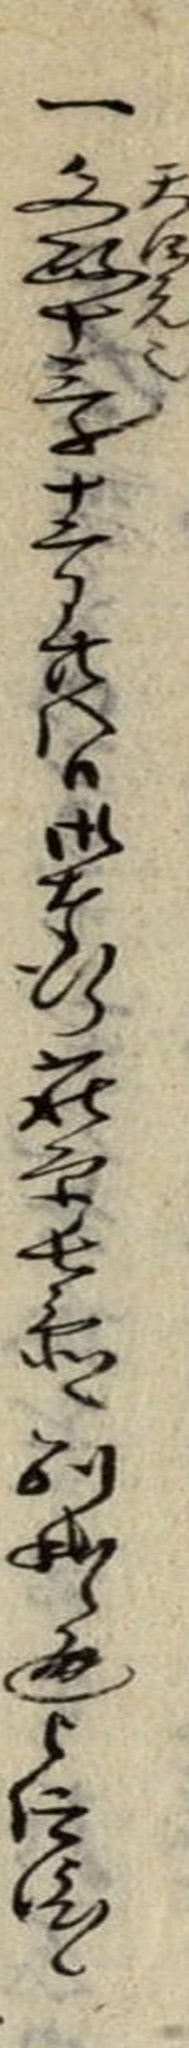一文政十三寅十二月廿八日御奉行萩原長兵衛へ別紙之通被仰渡候
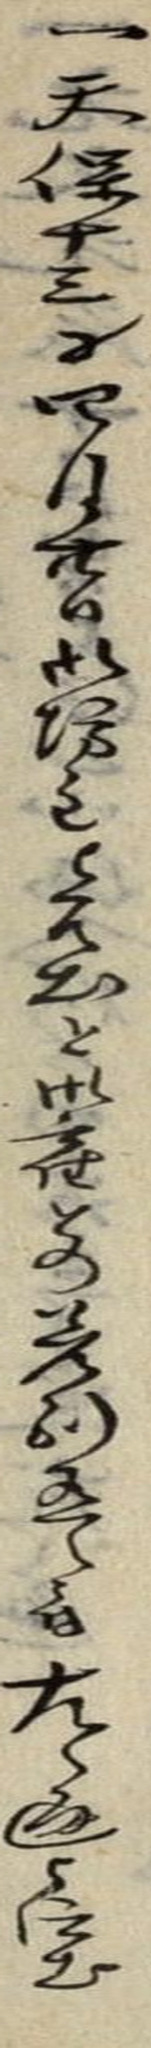一天保十三寅四月廿日御坊主被召出と御雇との差別有之に付左之通被仰出
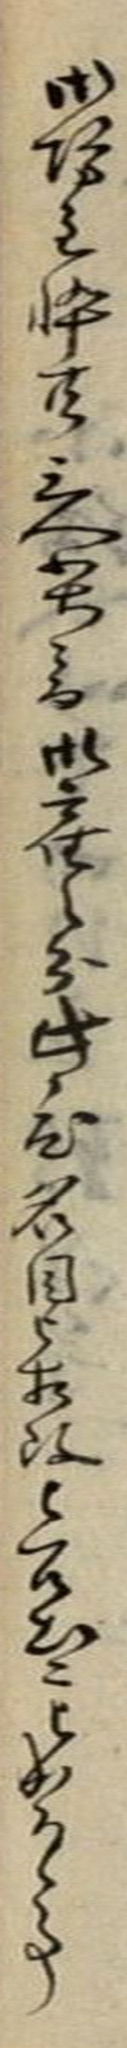御坊主忰共三人ふちに而御雇之分此度名目被相改被召出に被成下候事
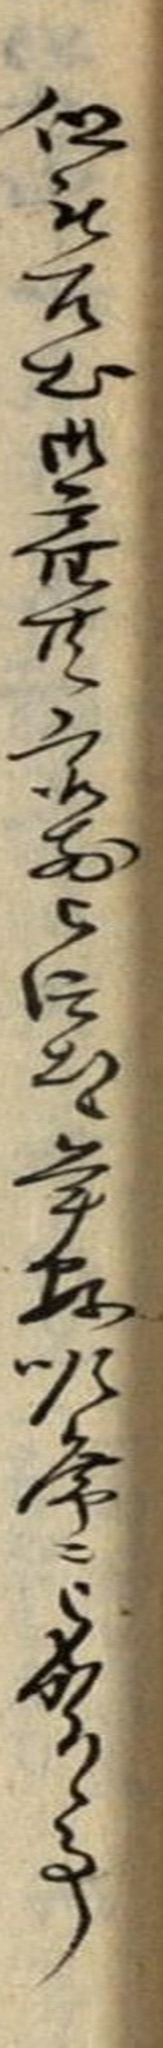但被召出御雇共へ最前被仰出候年数順席に被成下候事
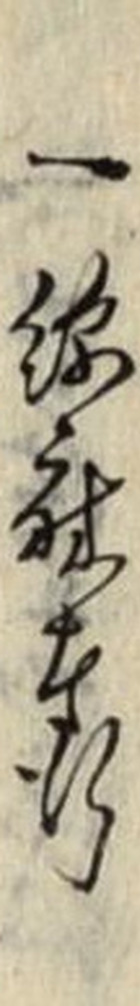一川除奉行
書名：御用并被仰出之部
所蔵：福井県文書館 Fukui Prefectural Archives
